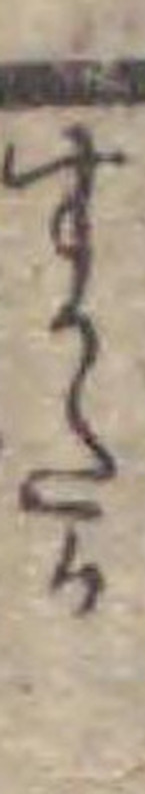すかたか
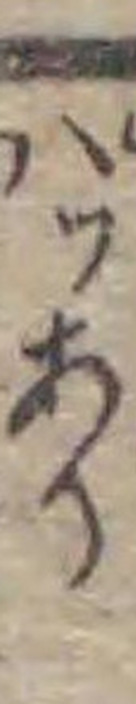八つあり
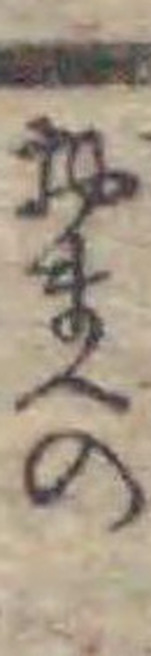おまへの
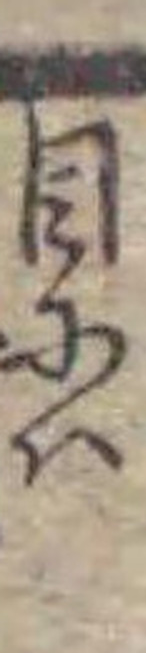目には
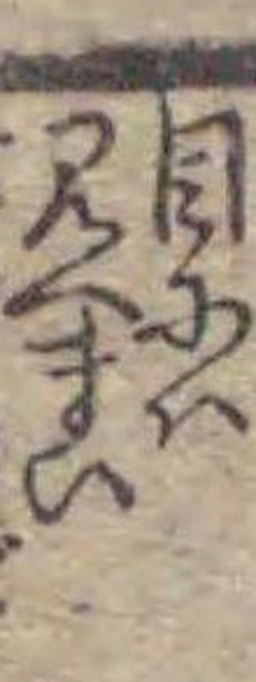見へまい
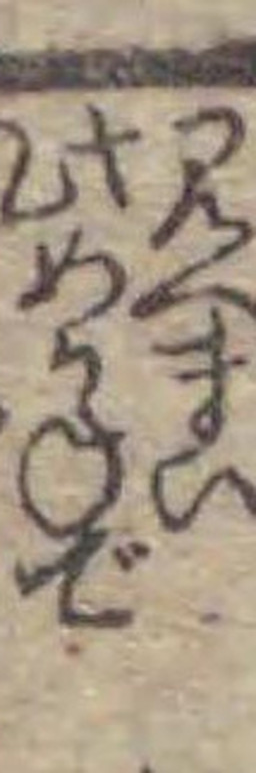此めかねで
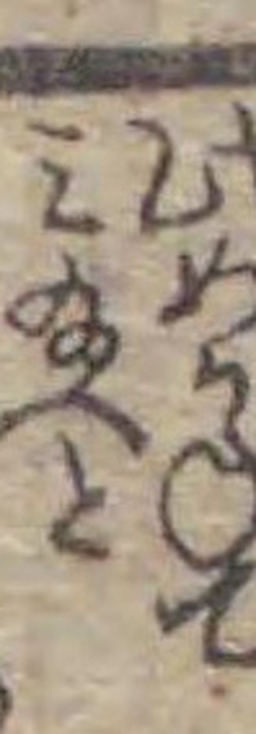み給へと
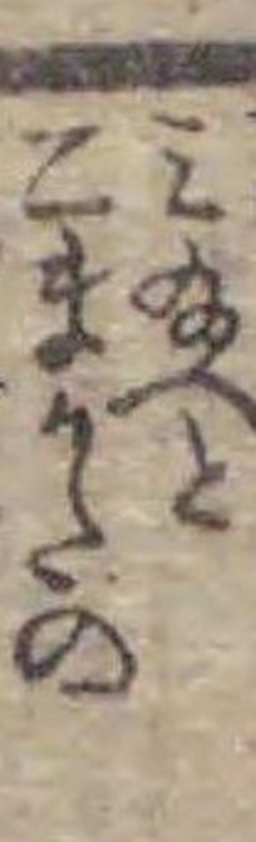こまかたの
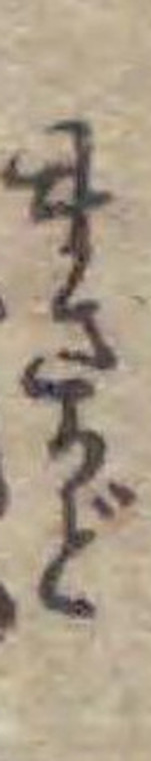まさかど
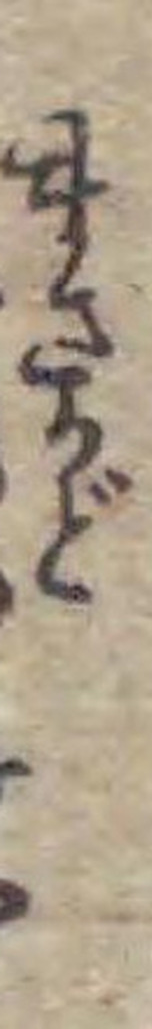まさかど
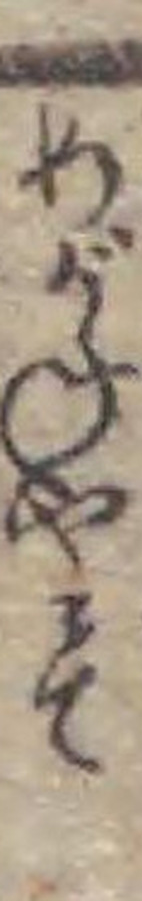めがねやにて
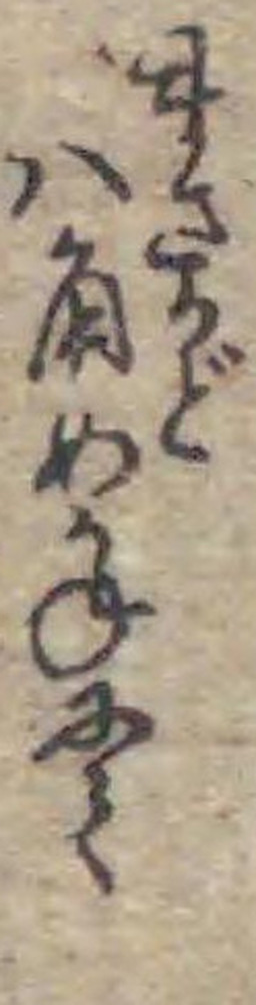八角めかねにて
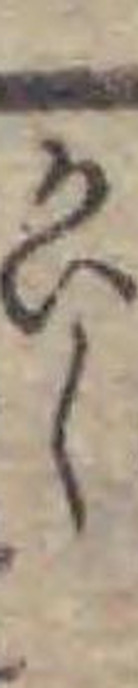かいし
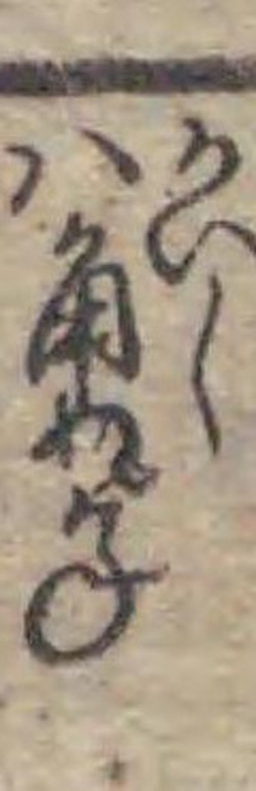八角めがね
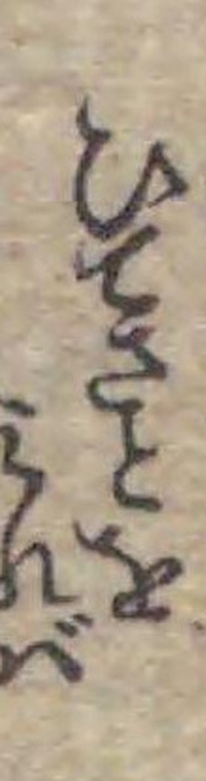ひてさとを
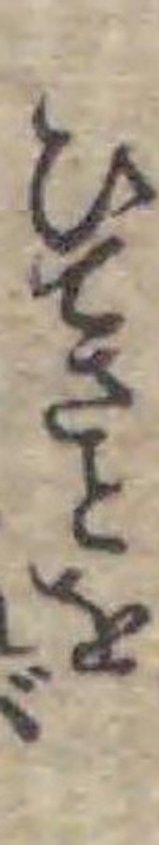ひてさとを
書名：時代世話二挺皷 : 2巻
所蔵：国立国会図書館 National Diet Library, JAPAN
